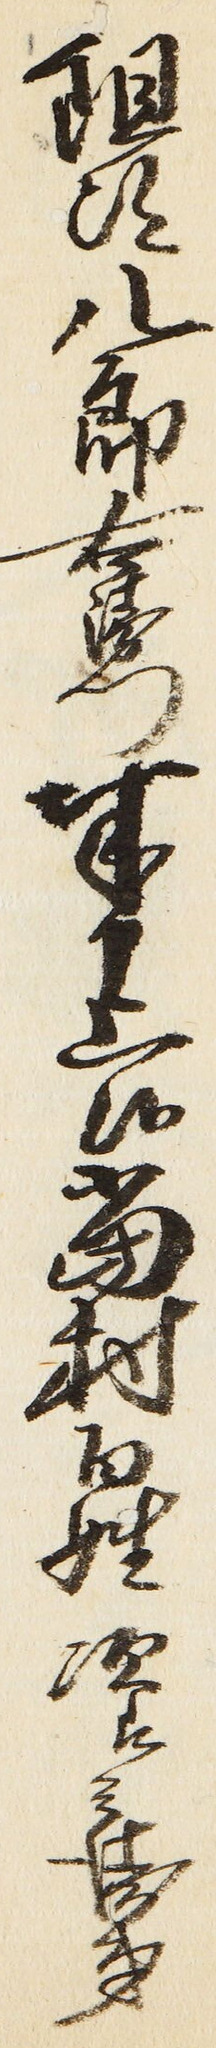組頭八郎右衛門奉申上候当村百姓次郎兵衛弟
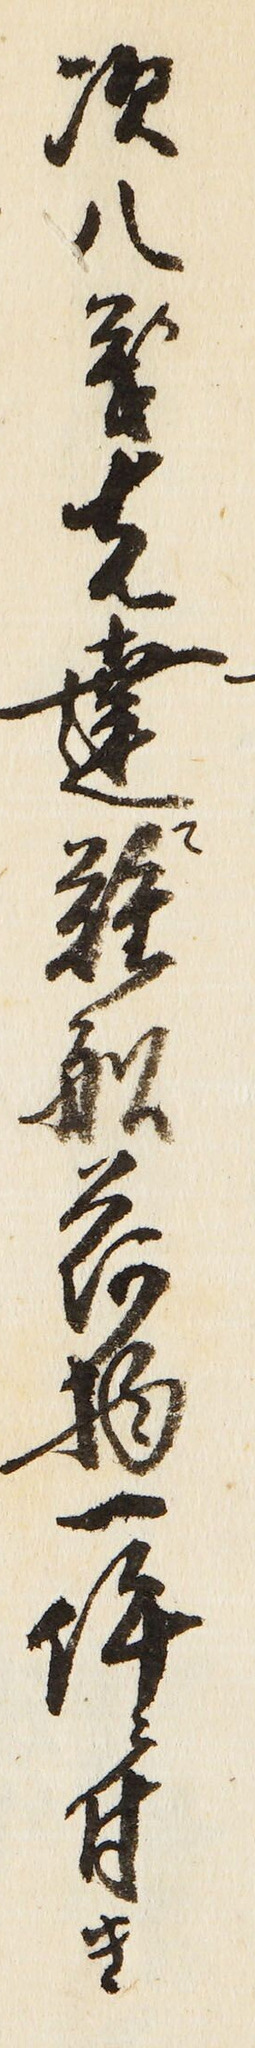次八義先達て難船荷物一件ニ付き
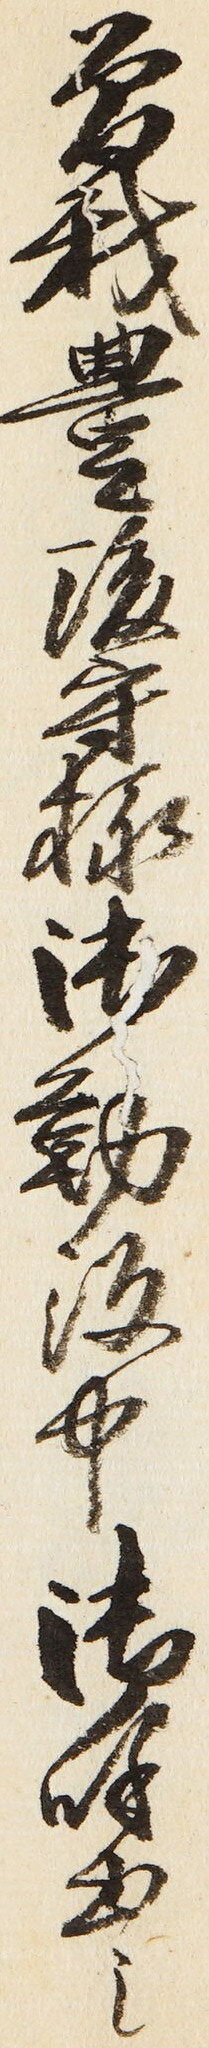曽我豊後守様御勤役中御呼出し
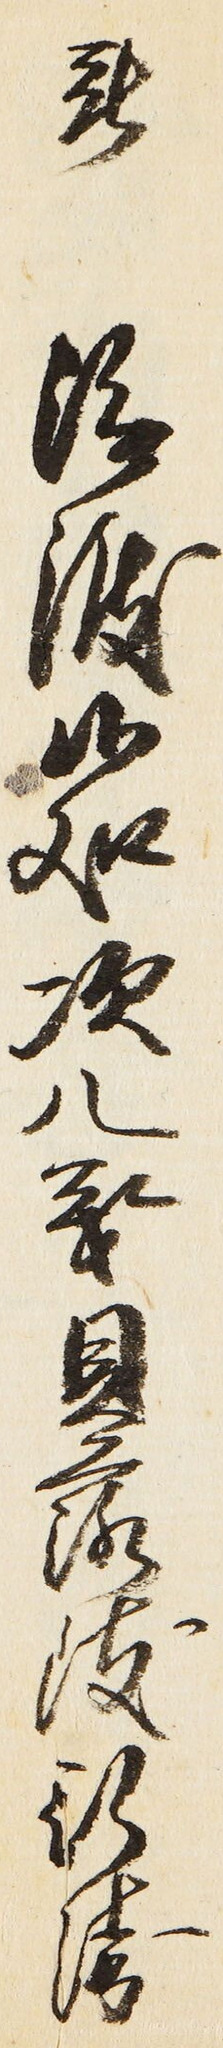被仰渡候処次八義貝落致行衛
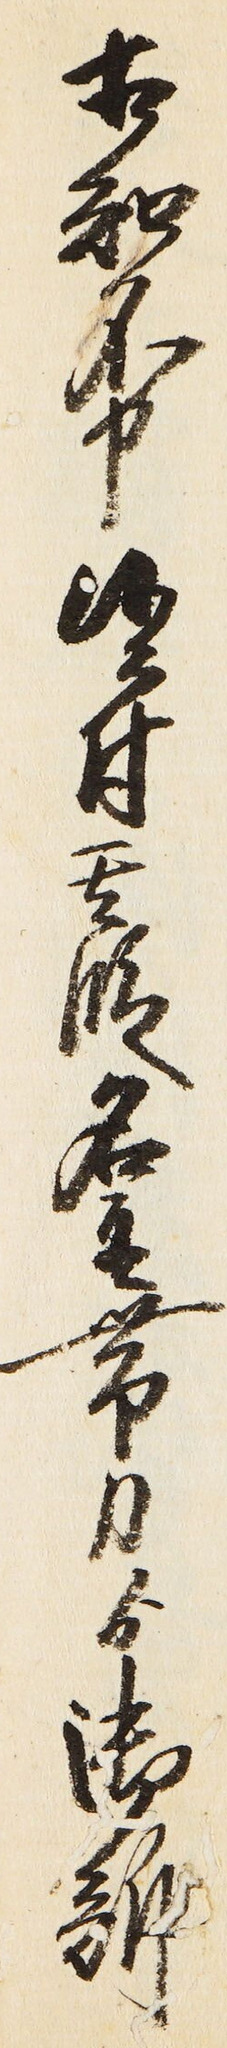相知不申候ニ付其段名主帯刀ゟ御訴
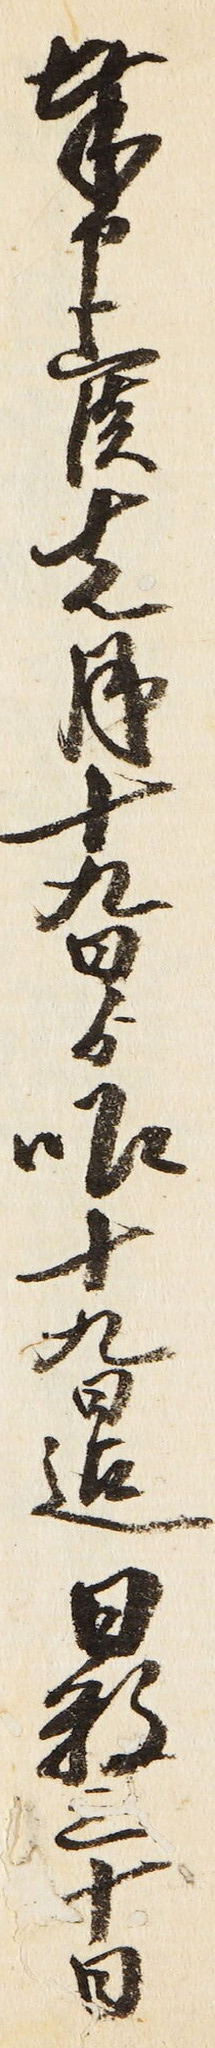奉申上候先月十九日ゟ昨十九日迄日数三十日
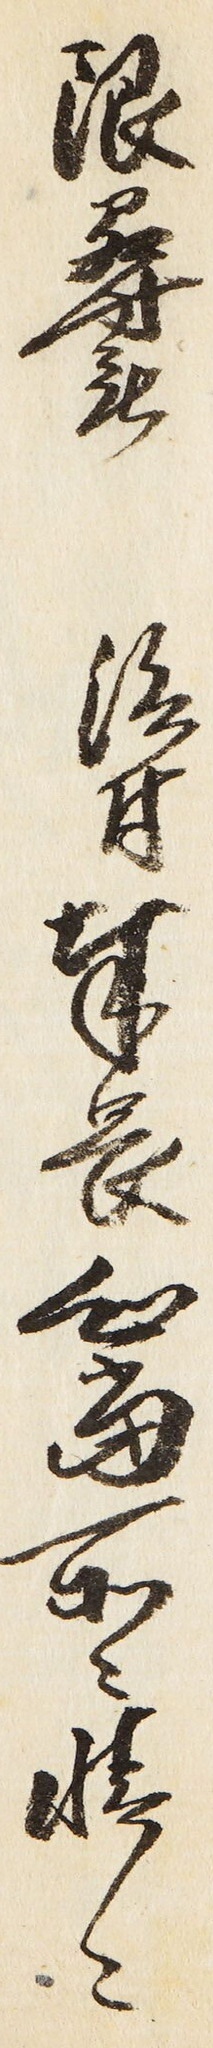限尋被仰付奉畏心当所々情々
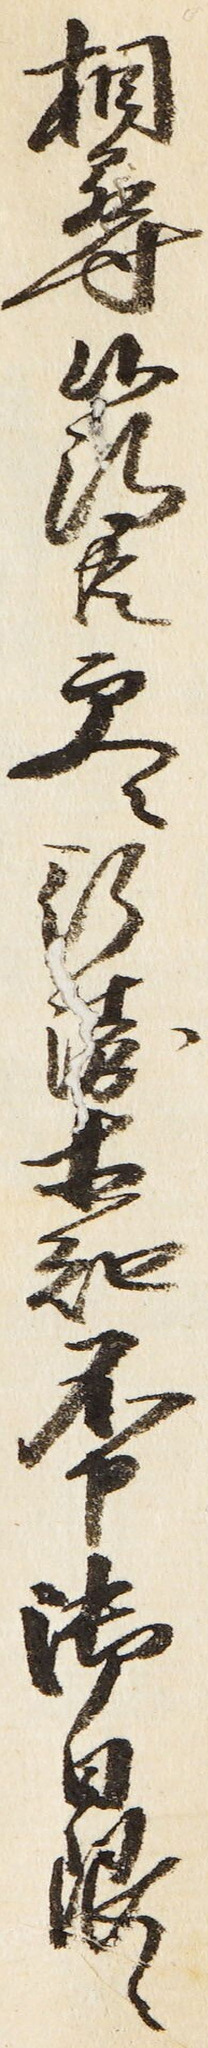相尋候得共更ニ行衛相知不申御日限ニ
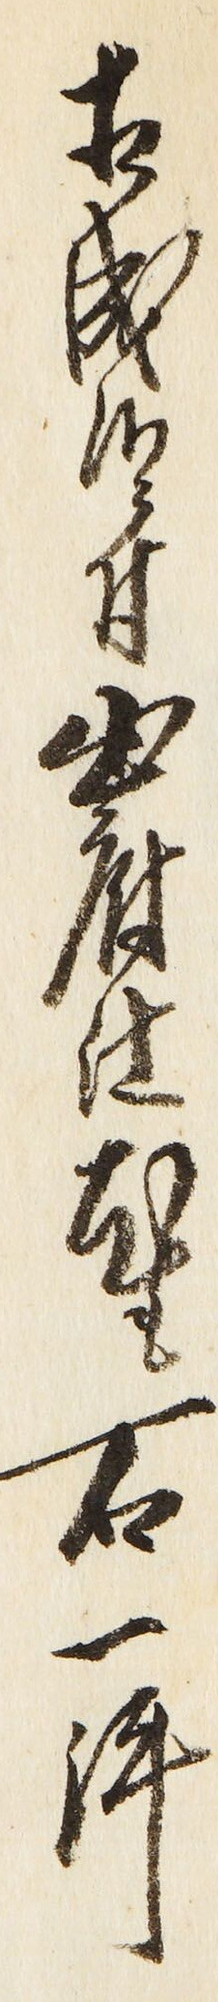相成候ニ付出府仕尤も右一件
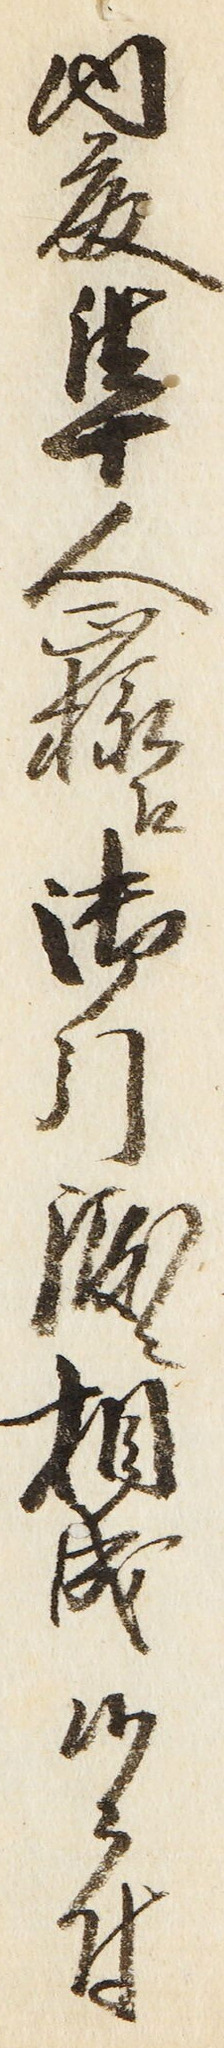内藤隼人正様江御引渡ニ相成候ニ付
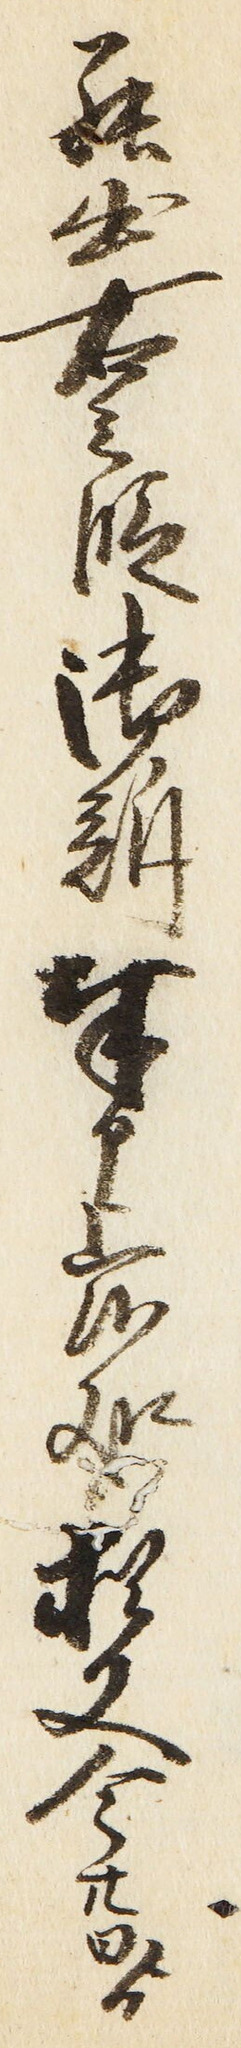罷出右之段御訴奉申上候処猶又今廿日ゟ
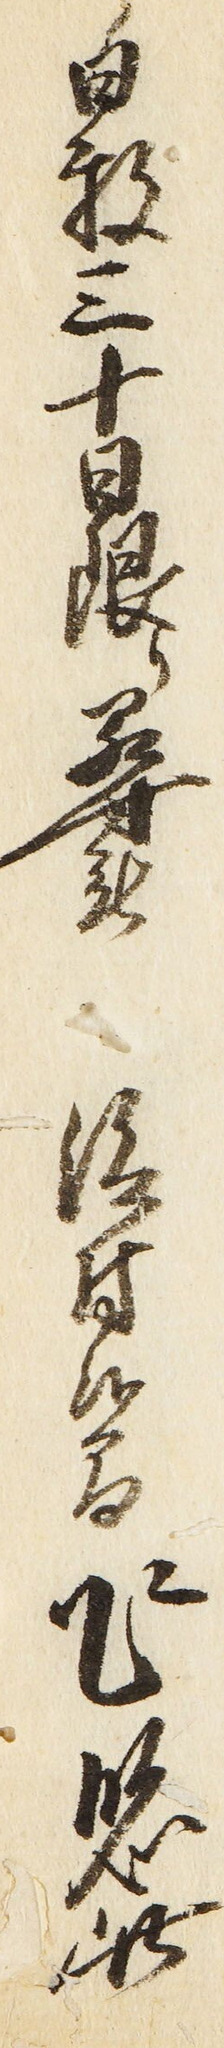日数三十日限り尋被仰付候間乍恐此

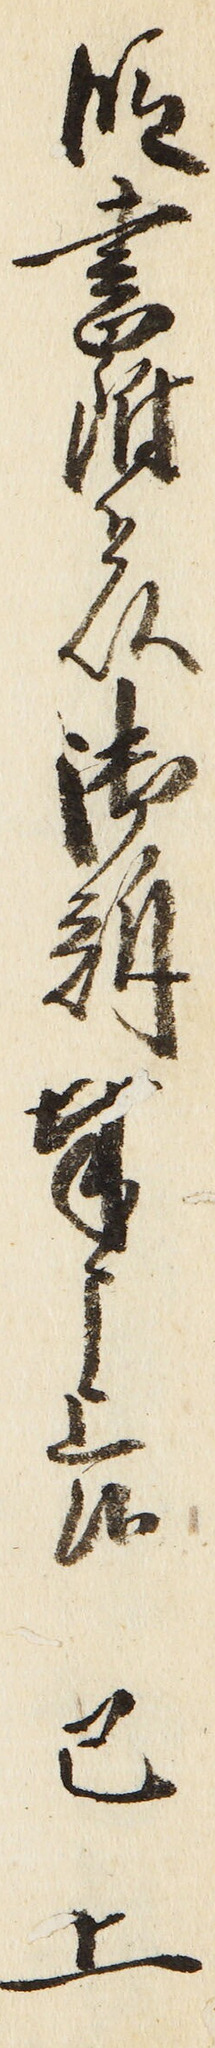段書付を以御訴奉申上候已上
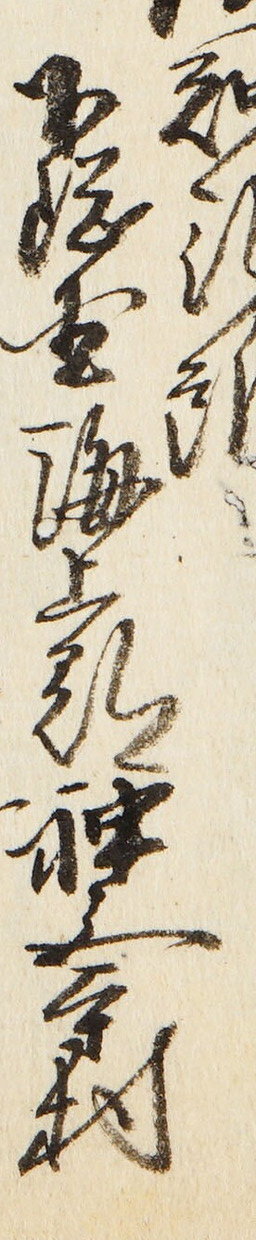下総国海上郡神宮寺村
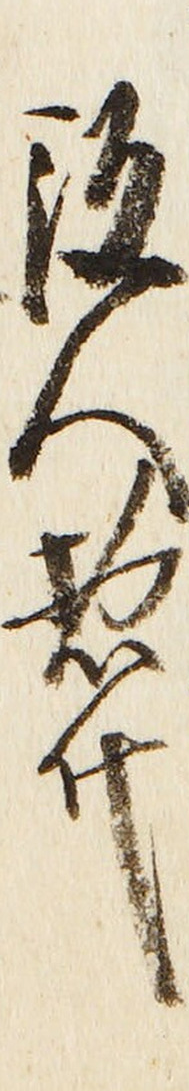役人惣代
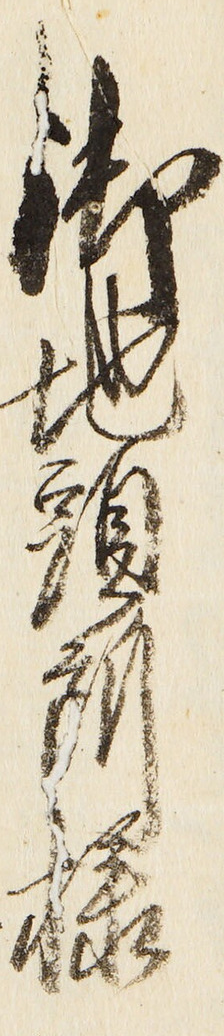御地頭所様
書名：難船一件記録
